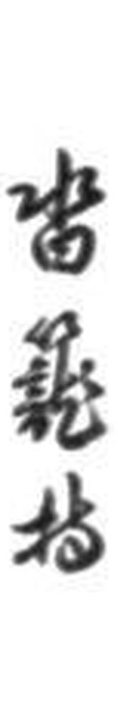轡籠持

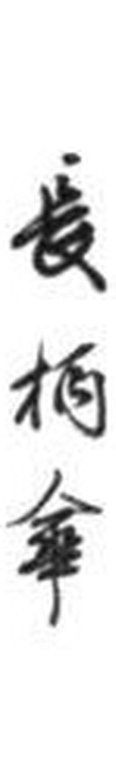長柄傘
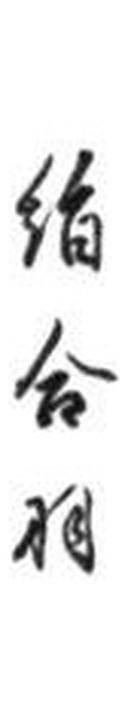絹合羽
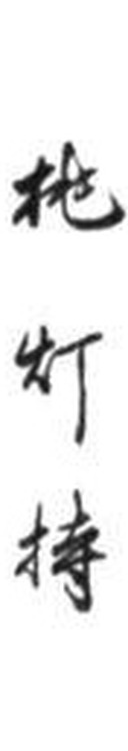挑灯持
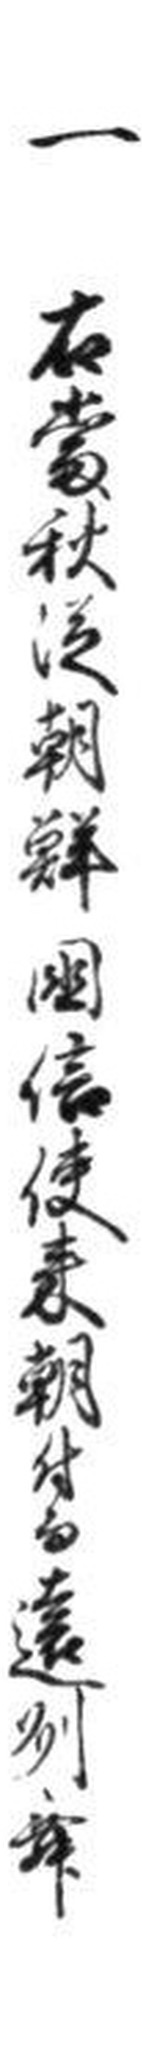一右当秋従朝鮮国信使来朝付而遠州舞
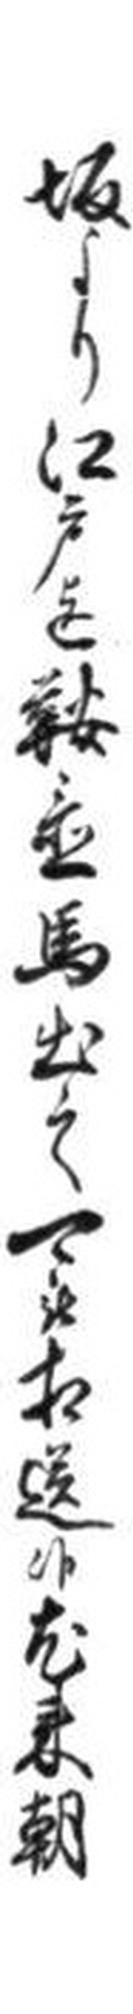坂より江戸迄鞍置馬出之可被相送候尤来朝
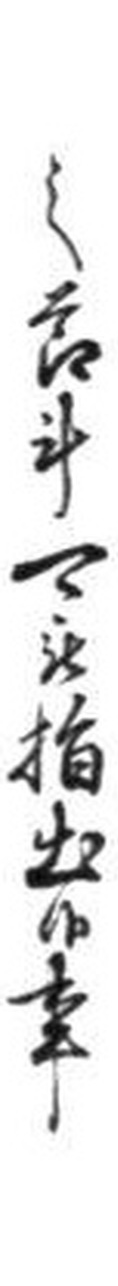之節斗可被指出候事
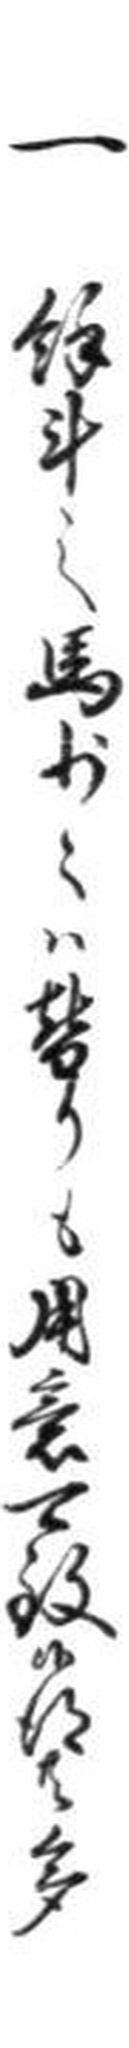一余計之馬少々ハ替りも用意可致候得共多
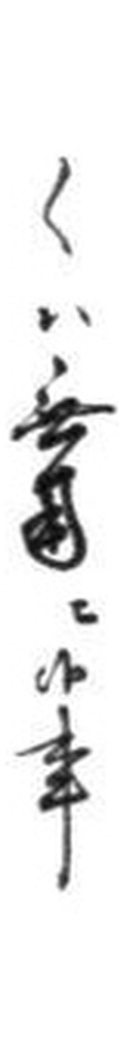くハ無用ニ候事
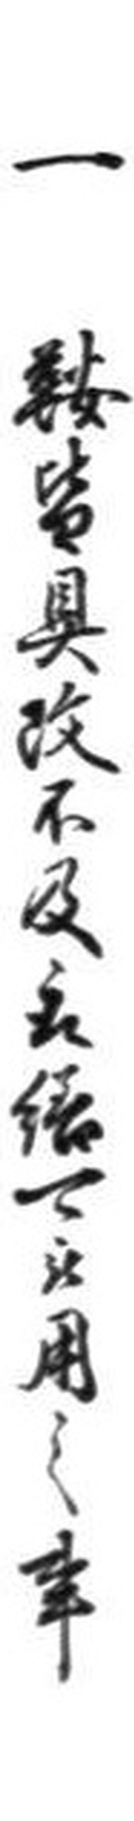一鞍皆具改不及取繕可被用之事
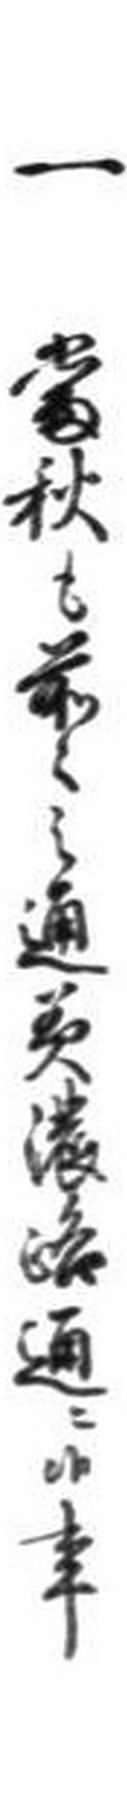一当秋も前々之通美濃路通ニ候事
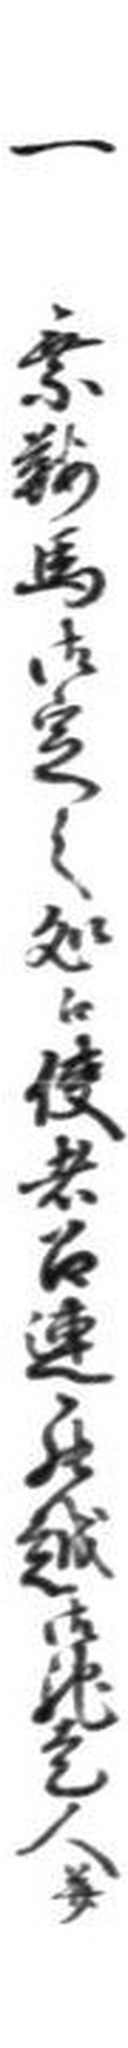一乗鞍馬御定之処江使者召連罷越御馳走人并
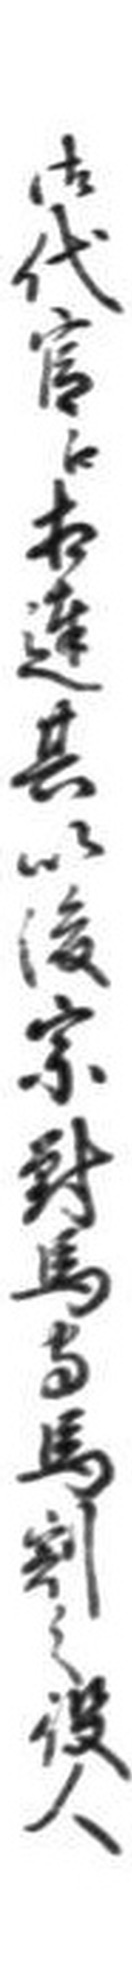御代官江相達其以後宗対馬守馬割之役人
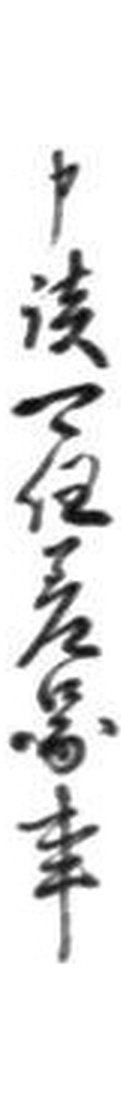申談可任差図事
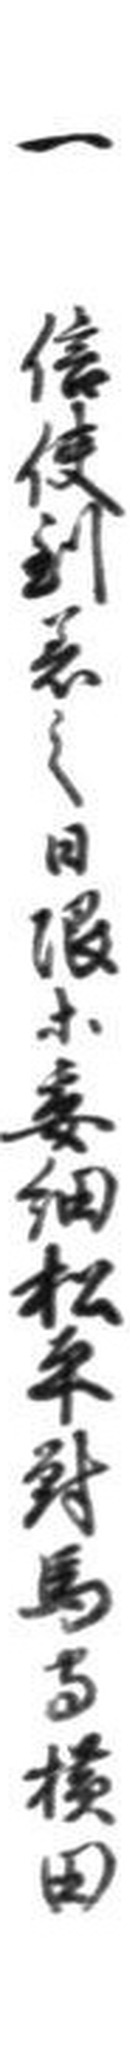一信使到着之日限等委細松平対馬守横田
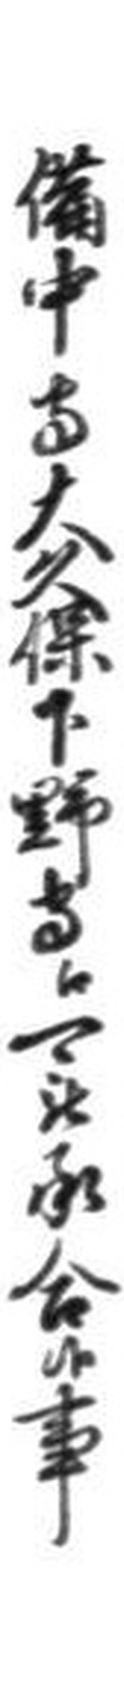備中守大久保下野守江可被承合候事
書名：家譜 三十三 吉邦公 享保四年
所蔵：福井県文書館 Fukui Prefectural Archives
